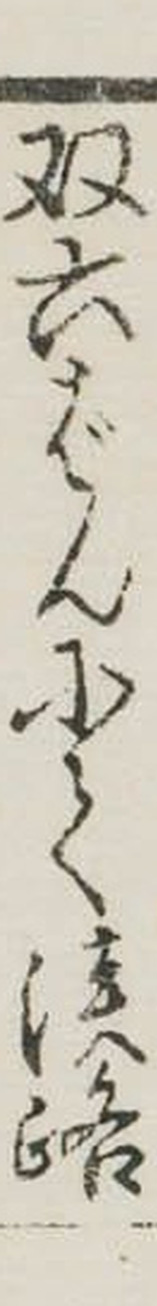双六ばんにて淡路
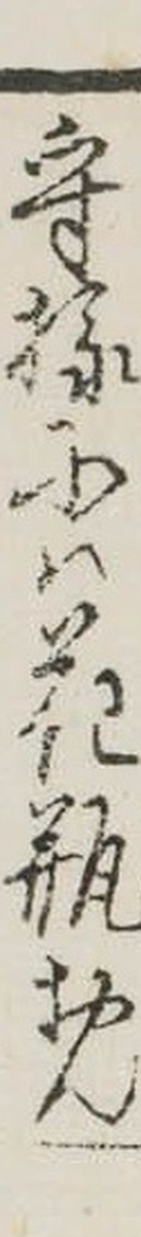守様には花瓶おん
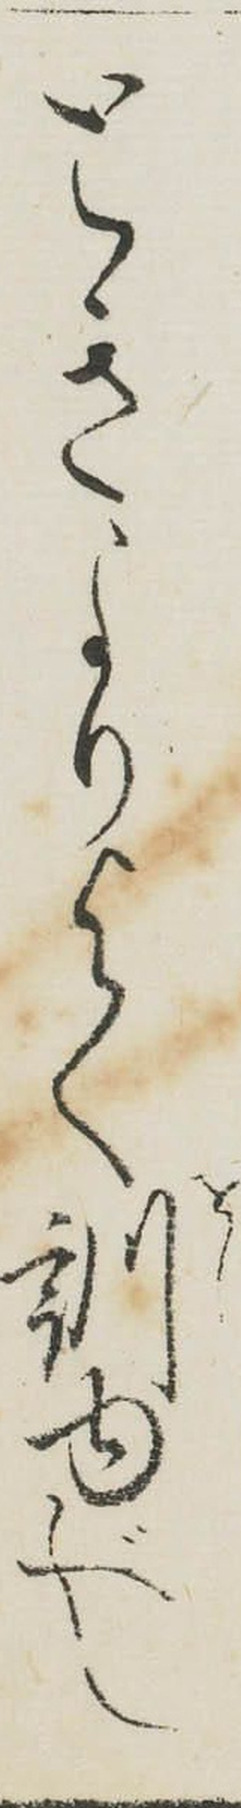ときよりよく訓ゆべし
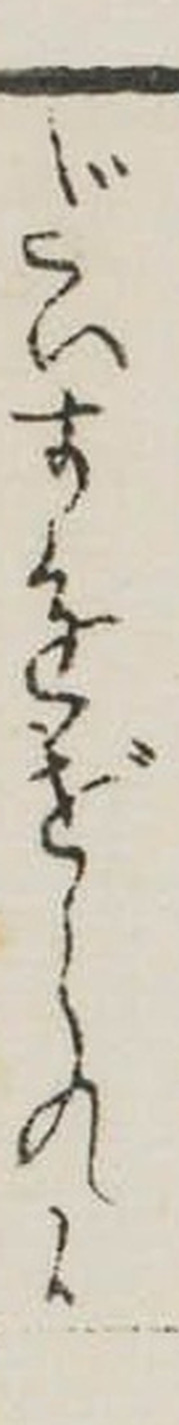だいす進ぜられ候
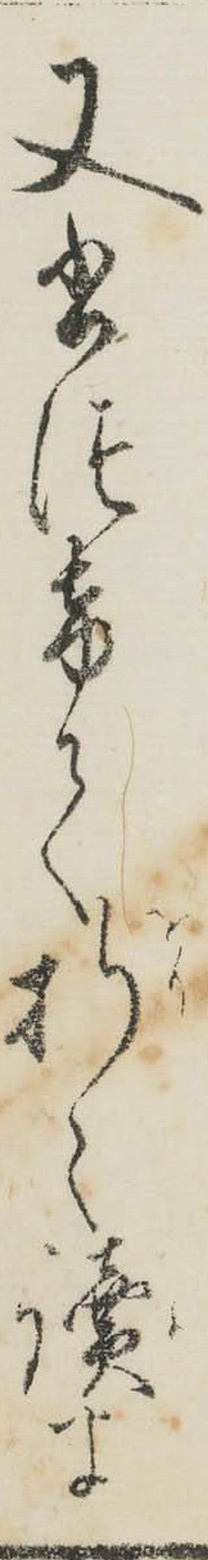又書つけて折々読ま
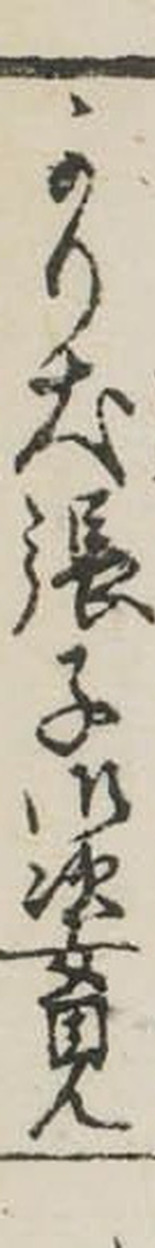より犬張子御姿見
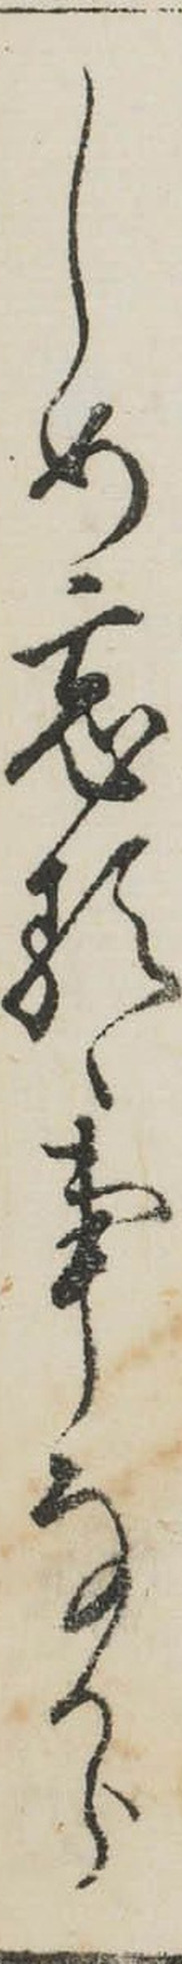しめ忘るゝ事なから

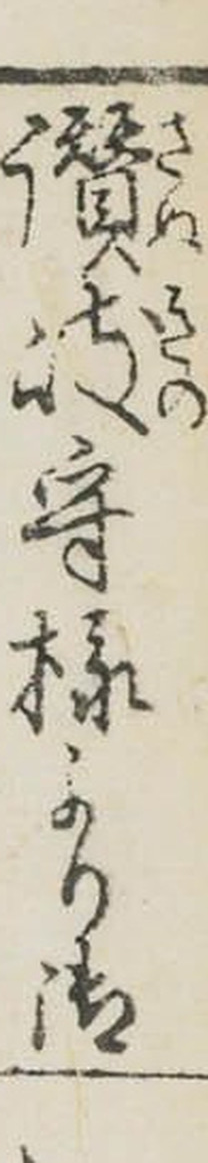讃岐守様より御
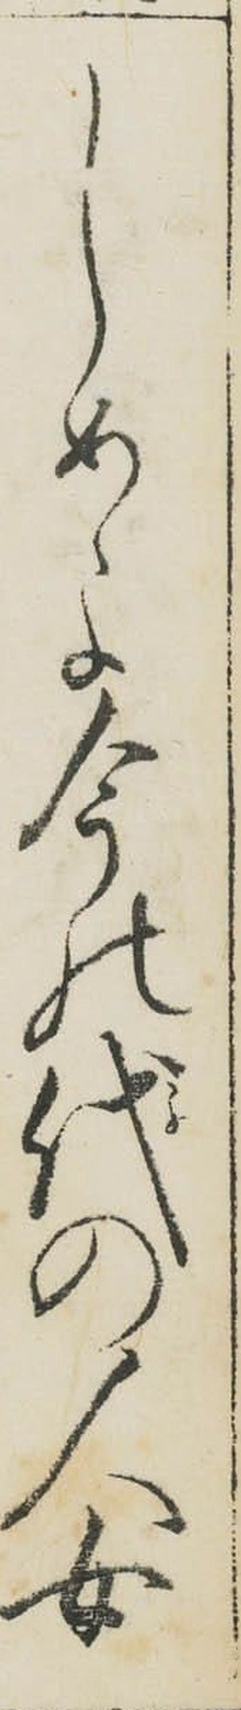しめよ今の代の人女
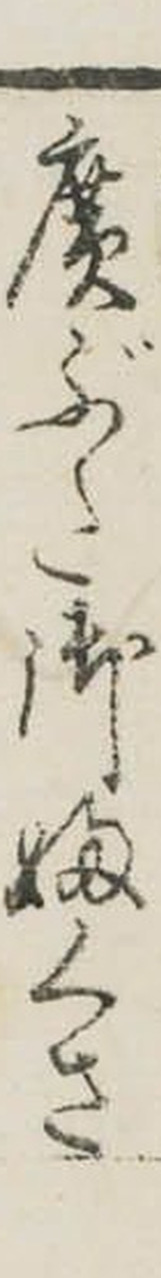廣ぶた御ふくさ
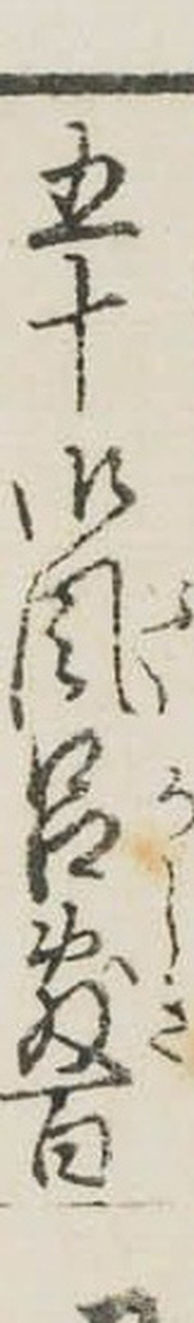五十御風呂敷百
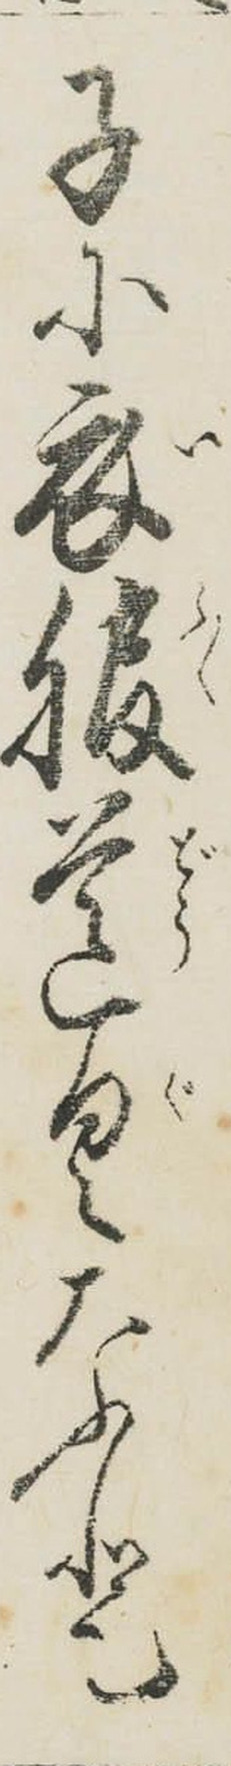子に衣服道具なと
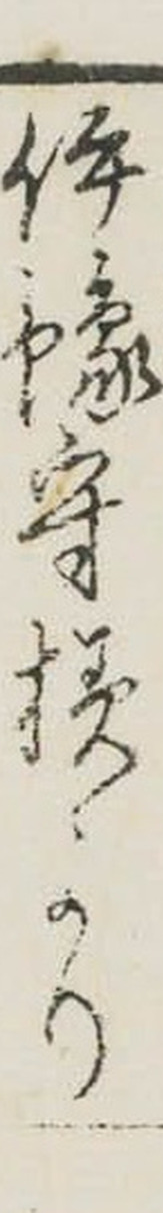伊豫守様より
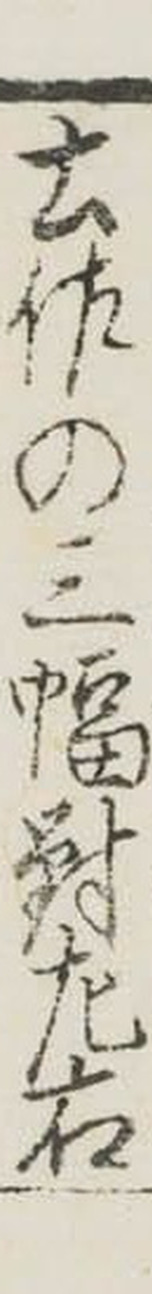土佐の三幅對左右
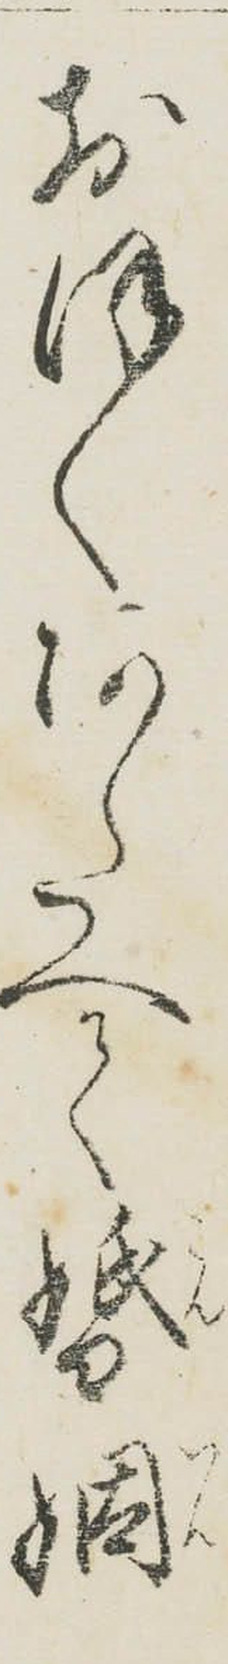おほくあたへて婚姻
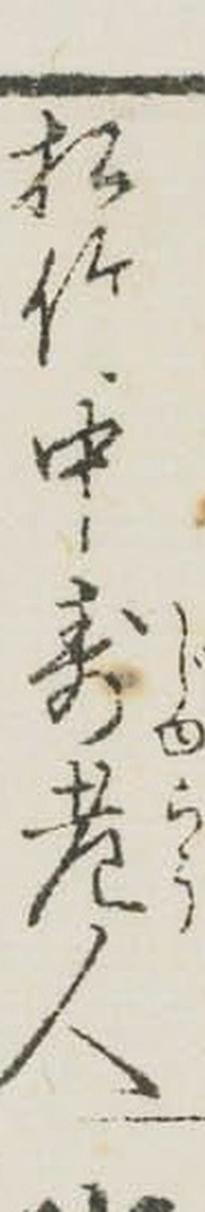松竹中寿老人
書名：女大学
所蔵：東京学芸大学教育コンテンツアーカイブ
